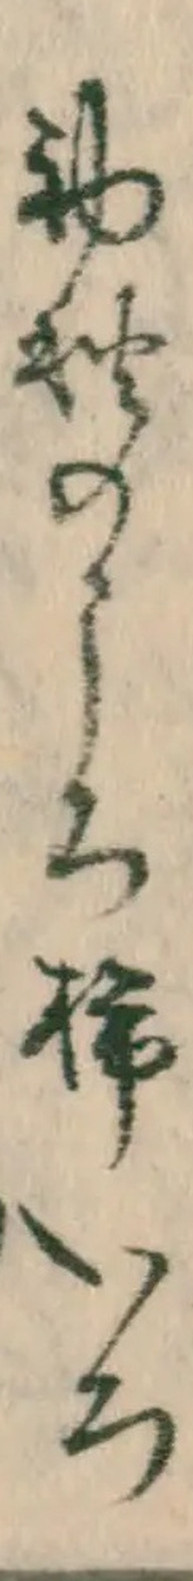初秋のころ柿いろ
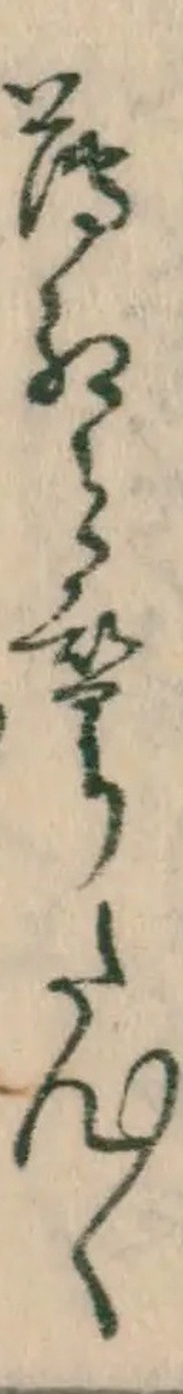薄紅と替りたん〳〵
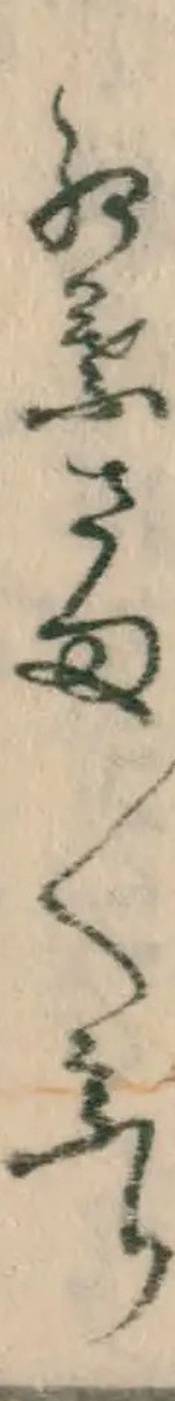紅葉さま〳〵なり
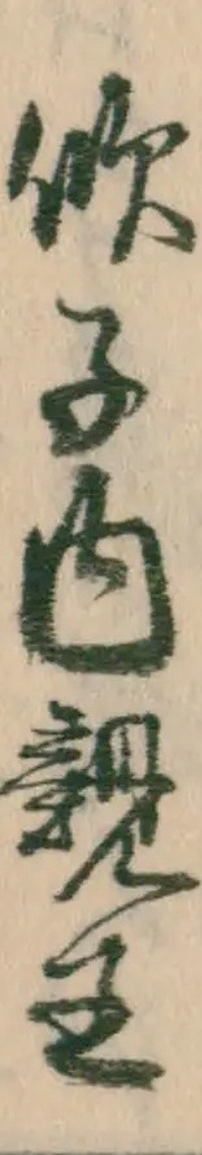欣子内親王
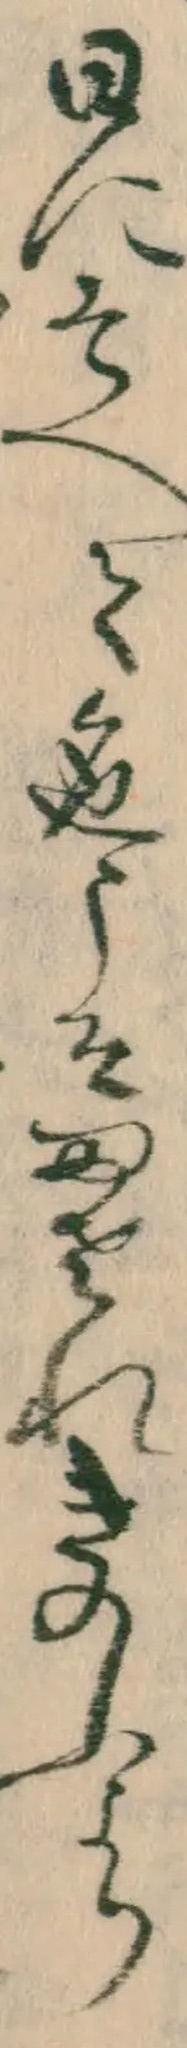日にそへて色こそまされきのふより
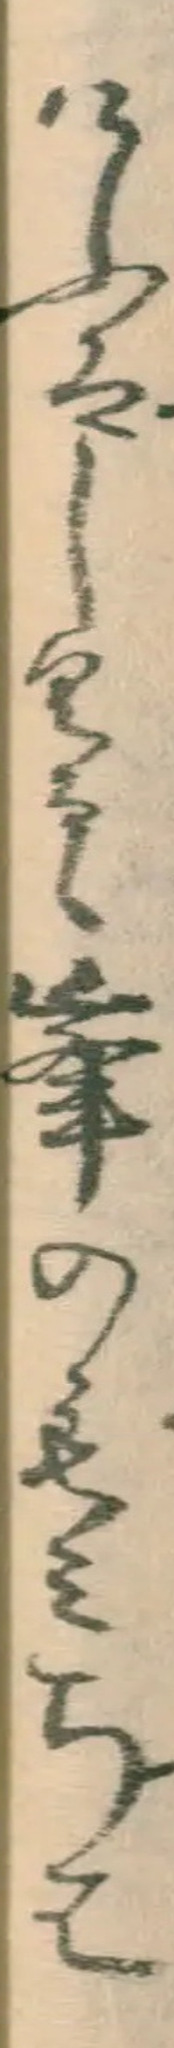けふはしくるゝ峯のもみちは
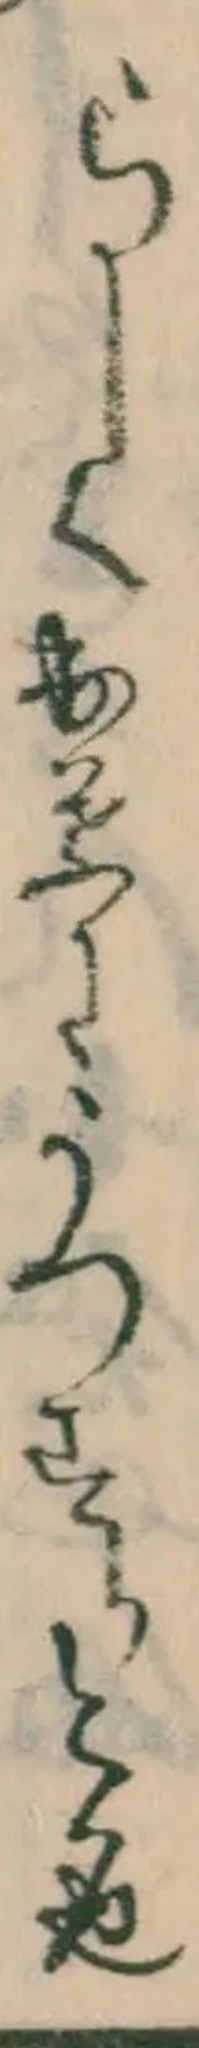らしく出葉にうつすらと色
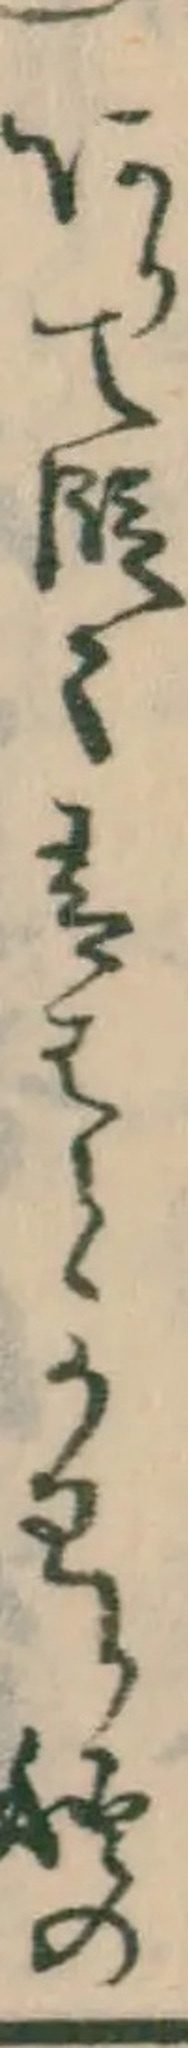ありて段々青はとかわり秋の
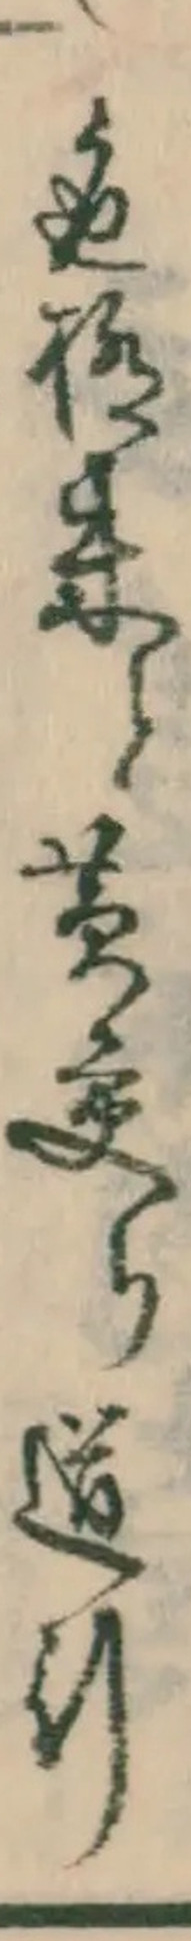色極朱と黄交り道行
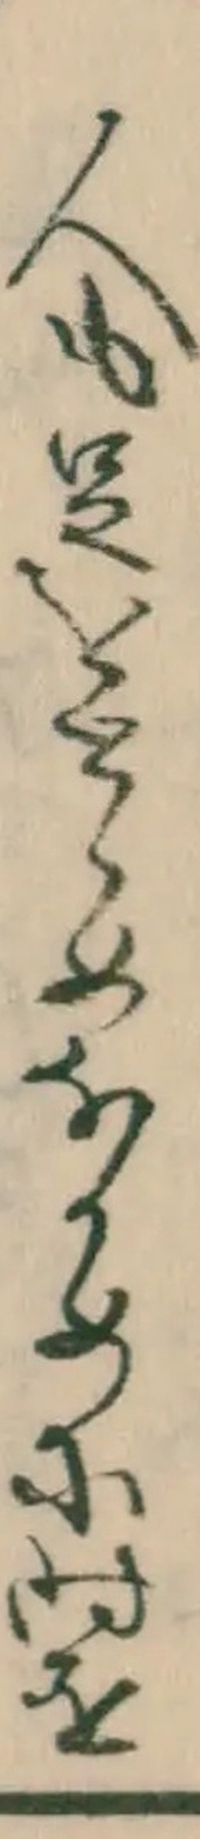人も足をとゝめなかめに時を
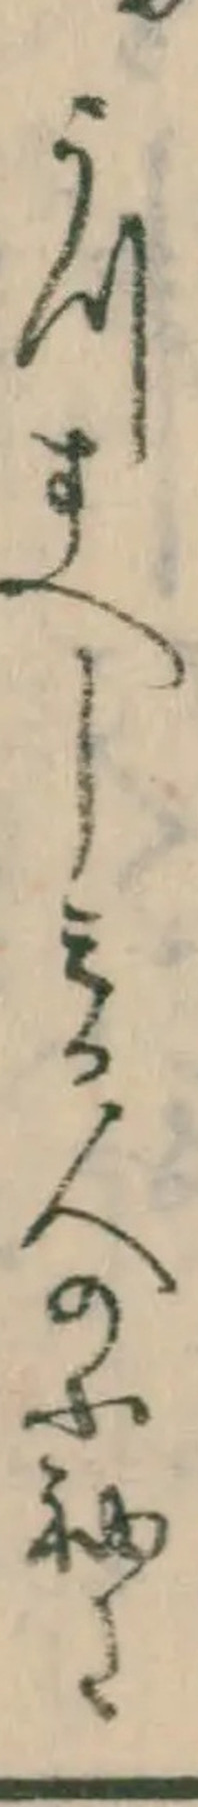うつすへしみる人の小袖に
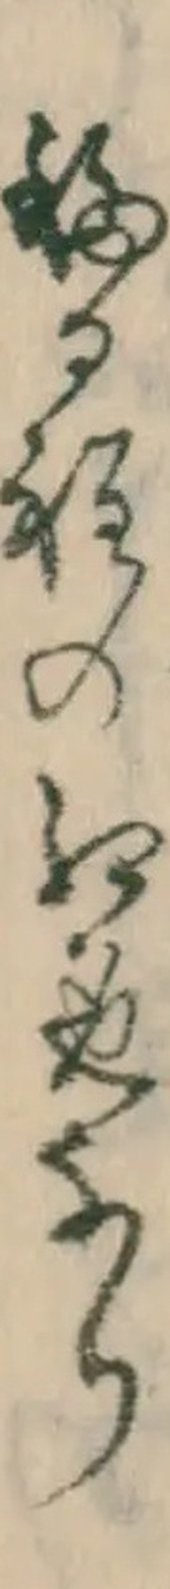移る程の紅色なり
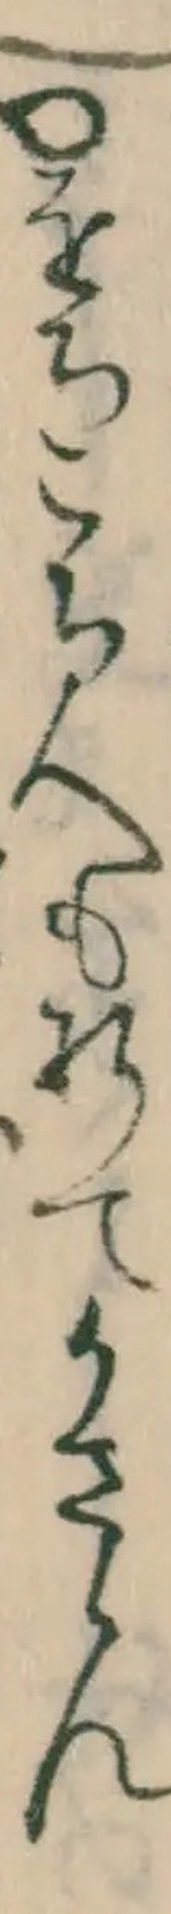○をちこち人も行てかさらん
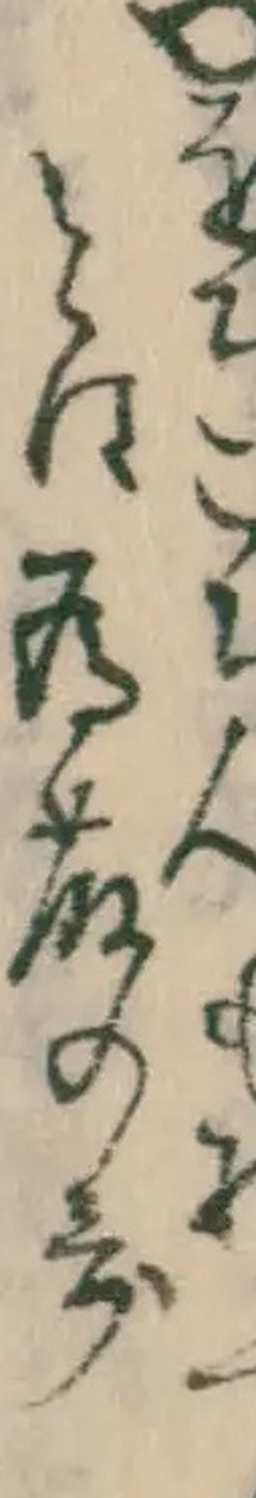とは爲藤の哥
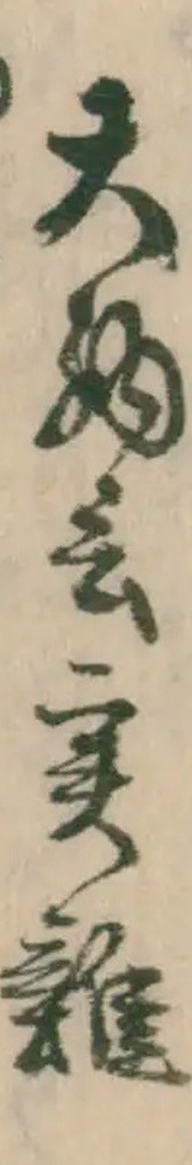大納言實雅
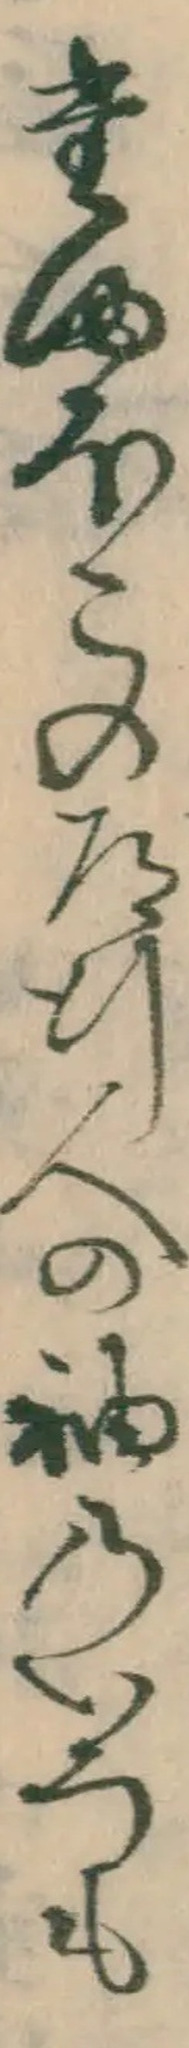たまほこの道行人の袖のいろも
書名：紅葉集
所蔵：国立国会図書館 National Diet Library, JAPAN
